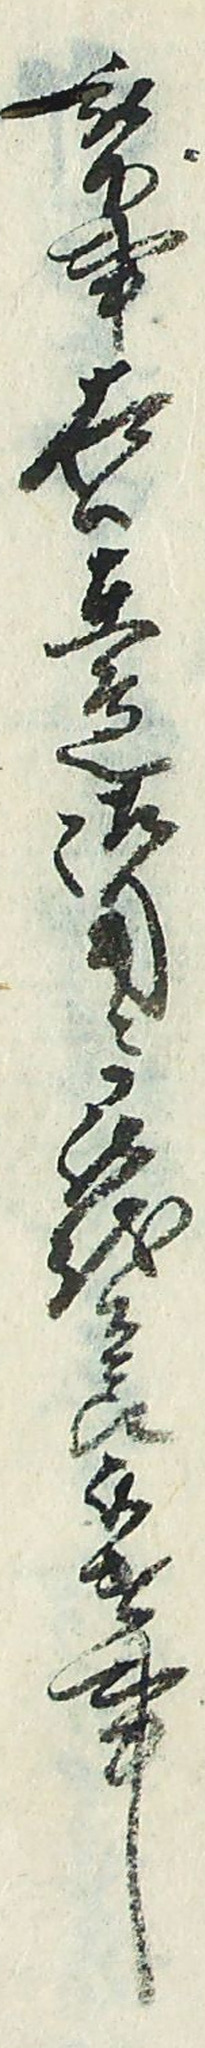被下事右は在辺御用に罷越候節被遣候事

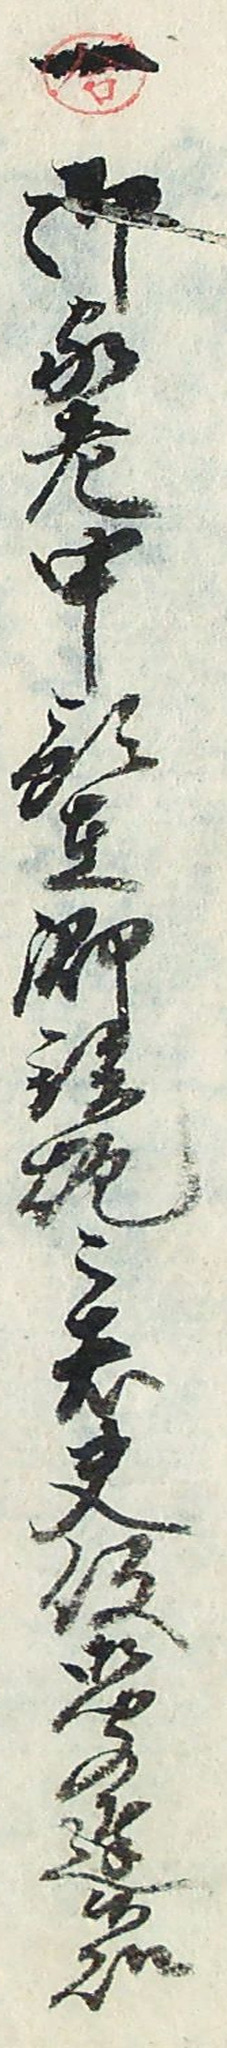一御家老中預在郷鉄炮の者夫役御聞達候処
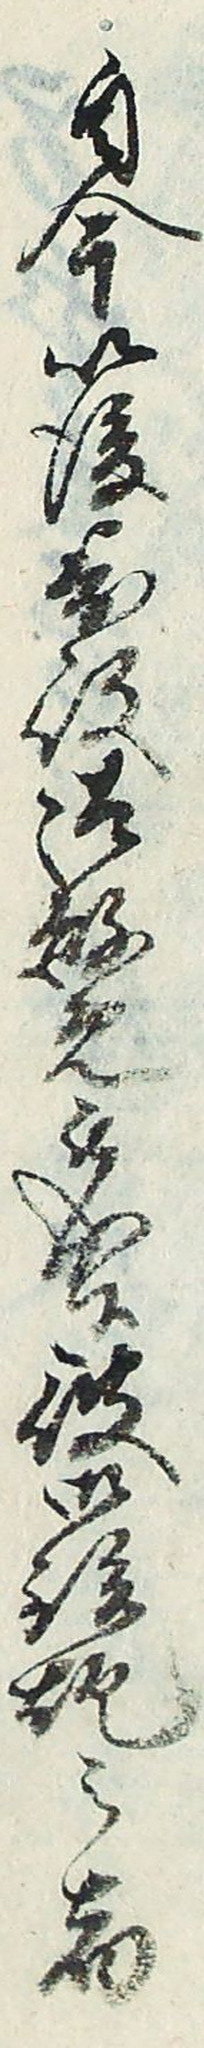自今以後前役御赦免被成候彼御鉄炮の者
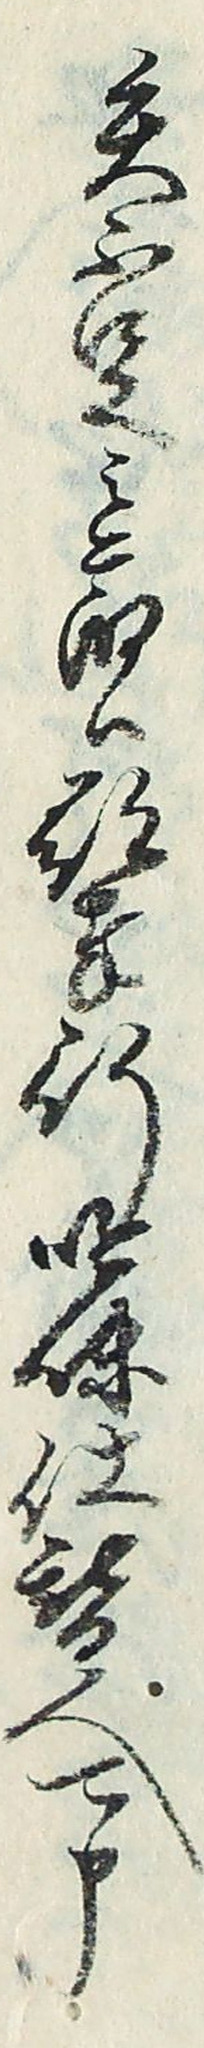矢不足の節は郡奉行吟味仕替人可申
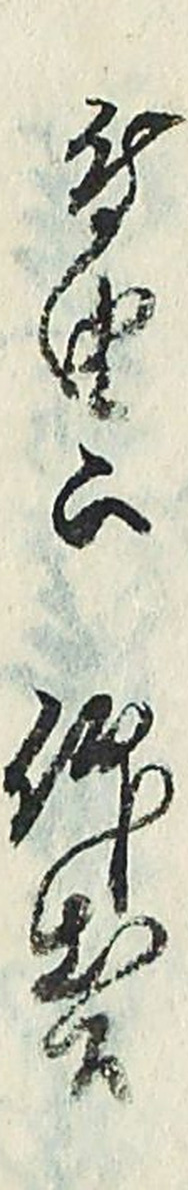付由被仰出候
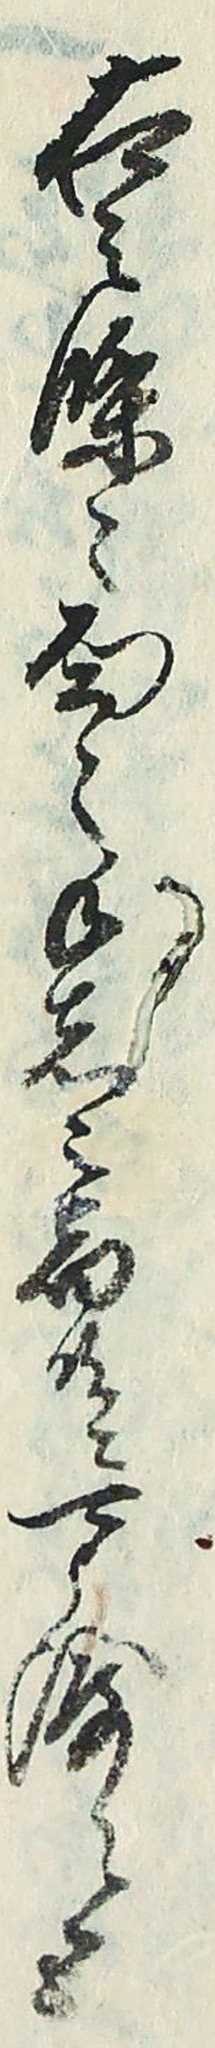右の條々面々手先の者共に可申渡候以上
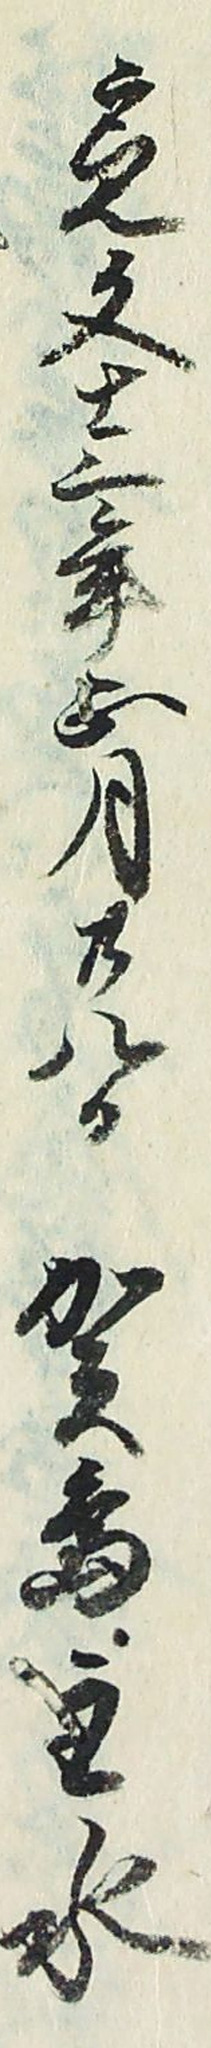寛文十三年正月二十八日賀島主水
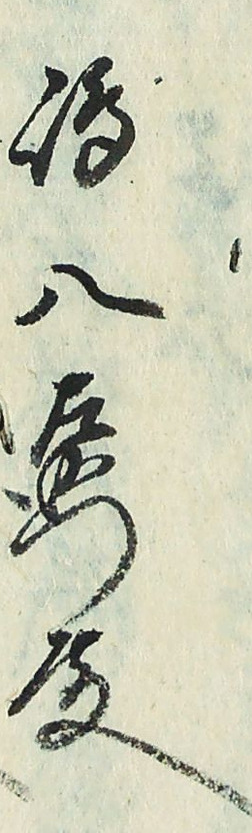嶋八左衛門殿
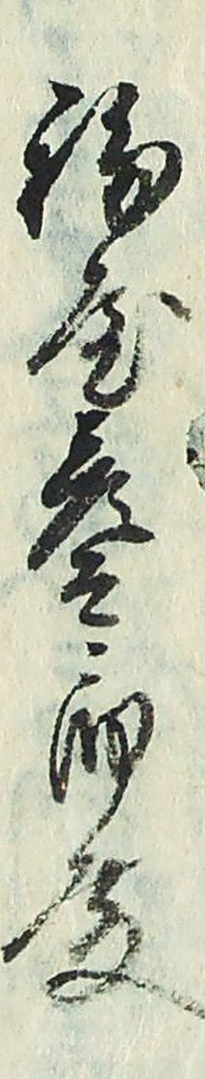福屋彦太郎殿
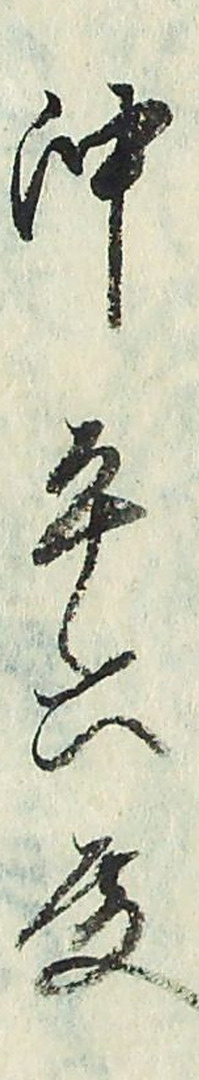沖兵六殿
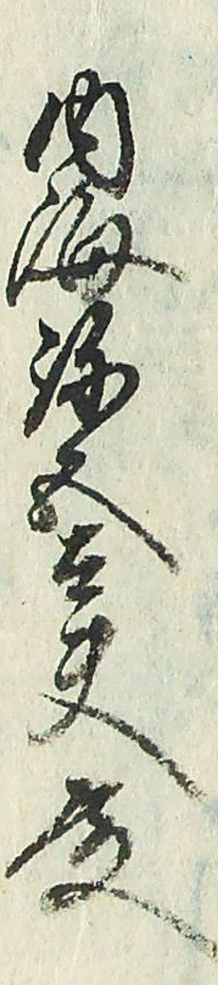内海弥五太夫殿

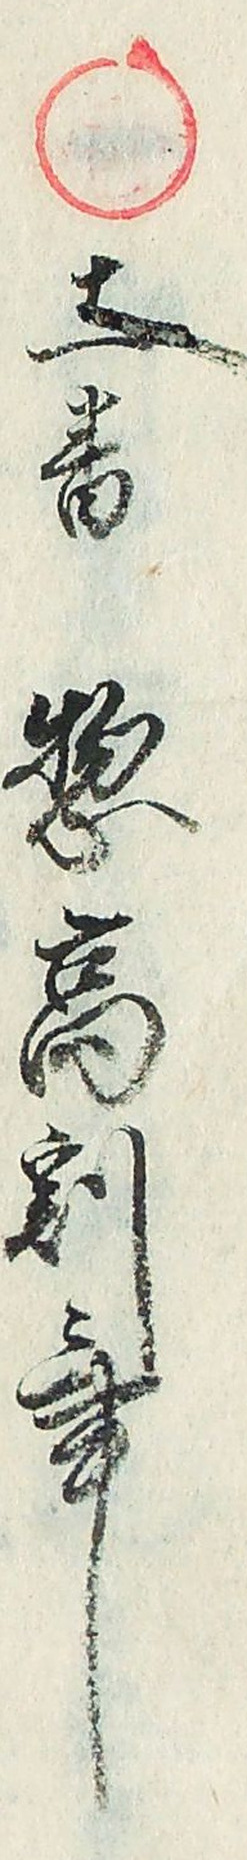十一番惣高割之事
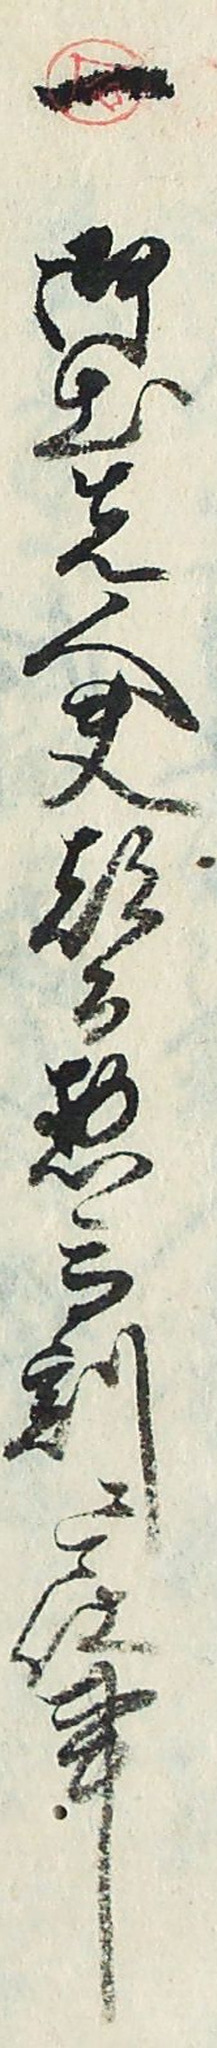一御出先人夫都て惣高割に可仕事
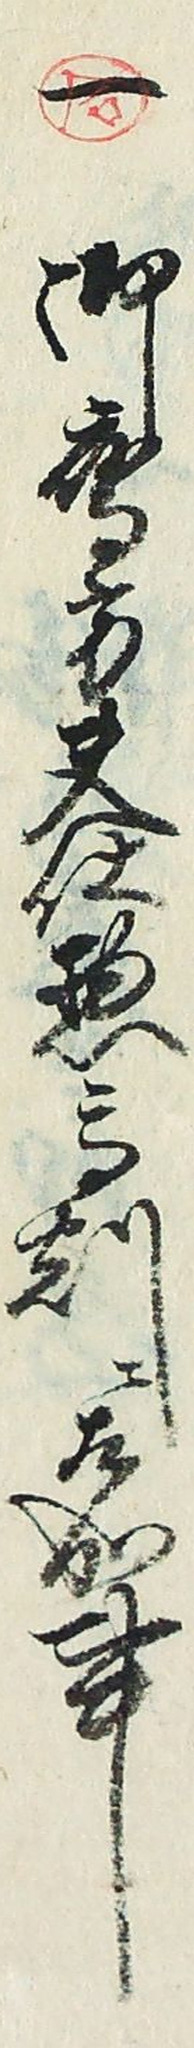一御鷹方夫仕惣高割に相成事
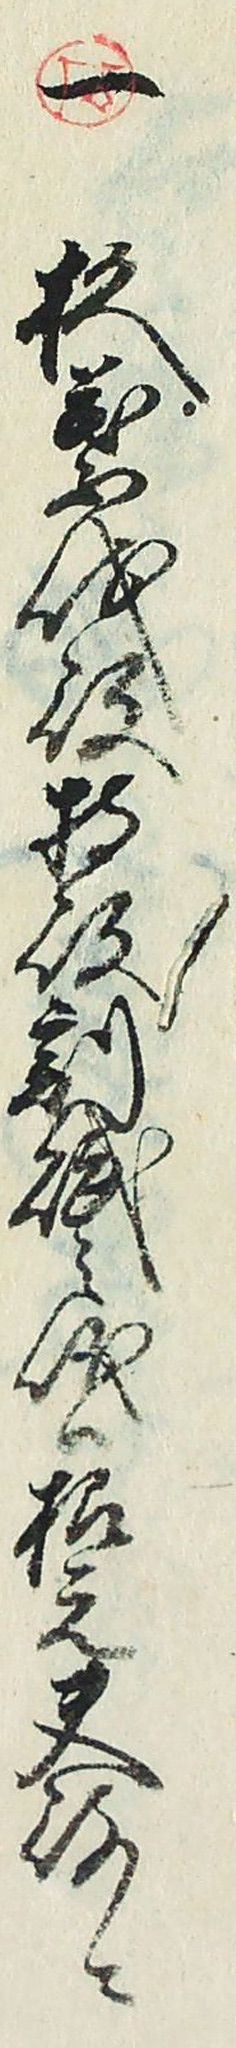一杉葉伐役持役割賦の儀は根元夫役に
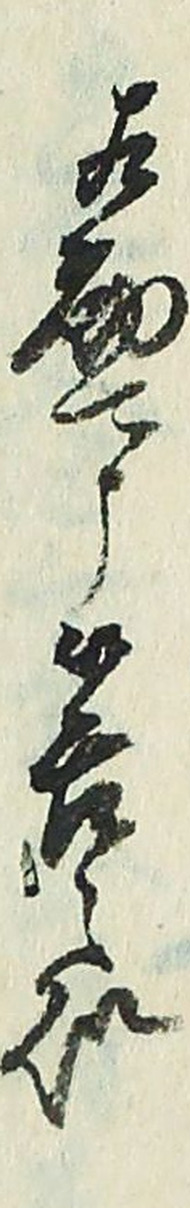相勤可申筈の処
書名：諸割賦物賃銀定記録帳
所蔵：鳴門教育大学 Naruto University of Education
